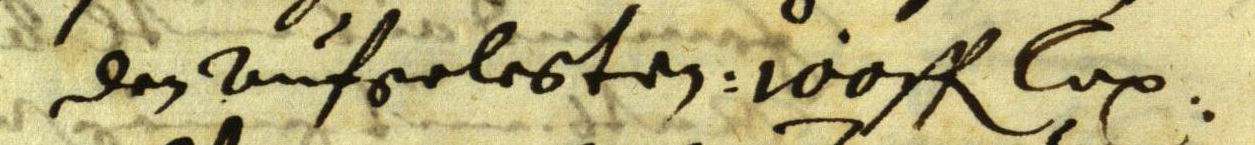Den Aūfgelegten: 100 ff Tax¬
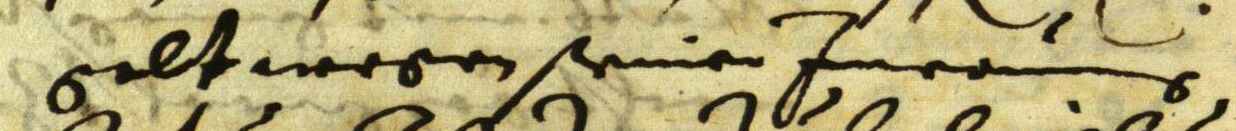gelt wegen seiner Inwonūng
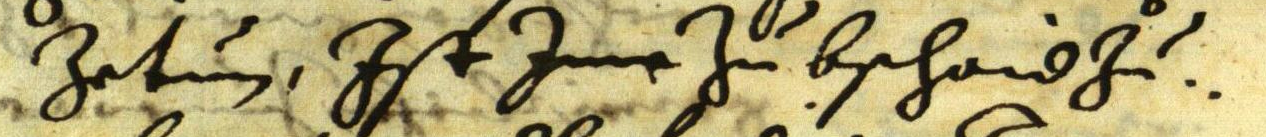Zetūn, Ist Ime Zū beschaid Zū¬
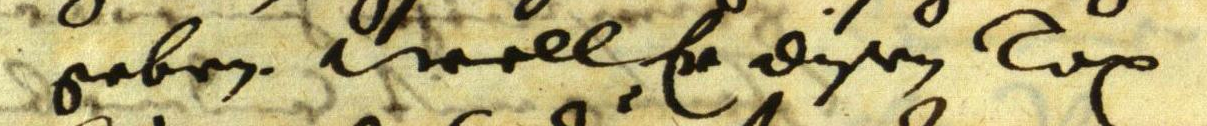geben. Well Er disen Tax
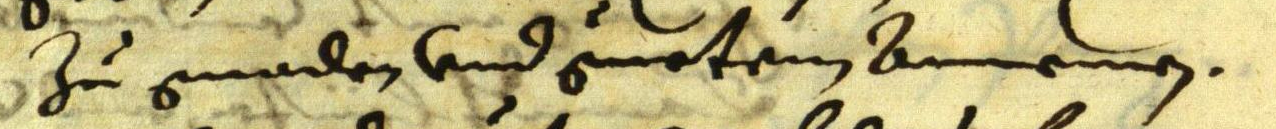Zū gnaden vnd gūetem Annemen.
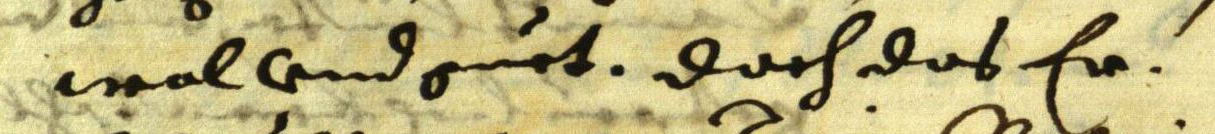wol vnd gūet. doch das Er.
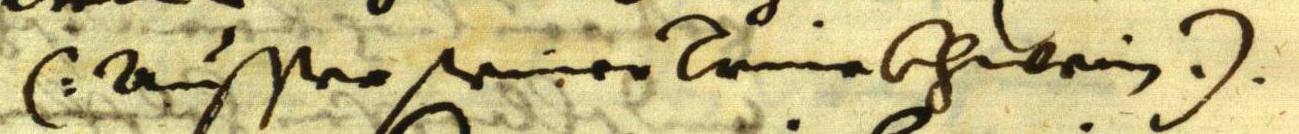(:Aūsser seiner Trinckhwein.).
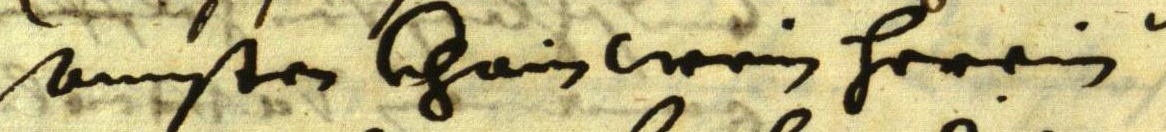sonnsten khain wein herein
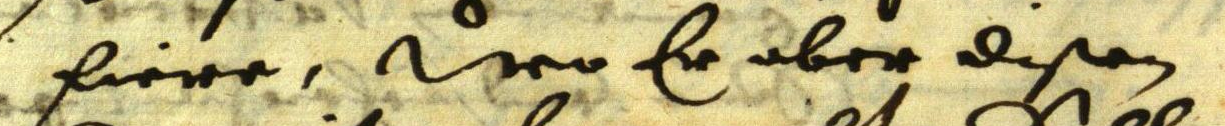fiere, wo Er aber disen
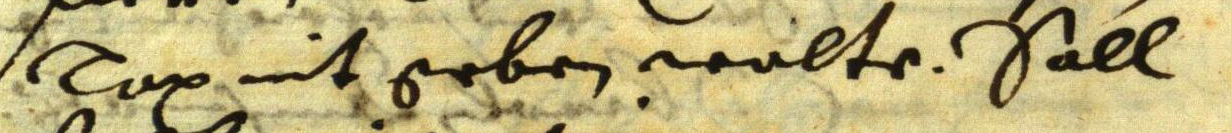Tax nit geben wolte. Soll
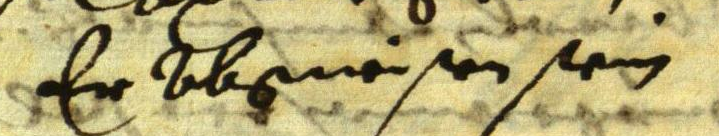Er Abgwisen sein.
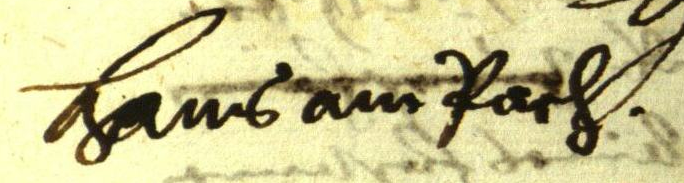Hans am Pach.
